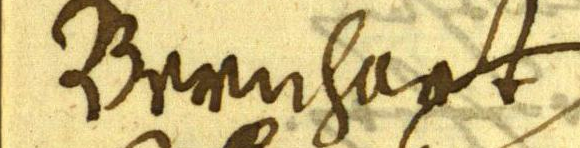Bernhart
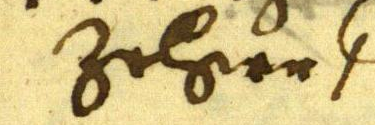Zelger/
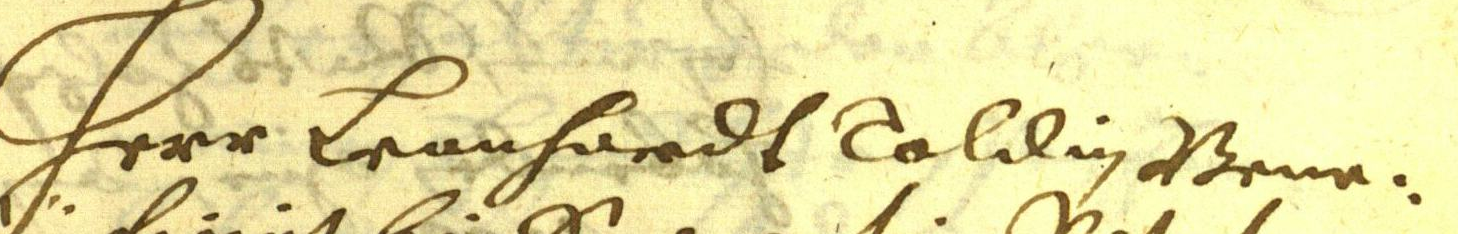Herr Leonhardt Toldin Bene¬
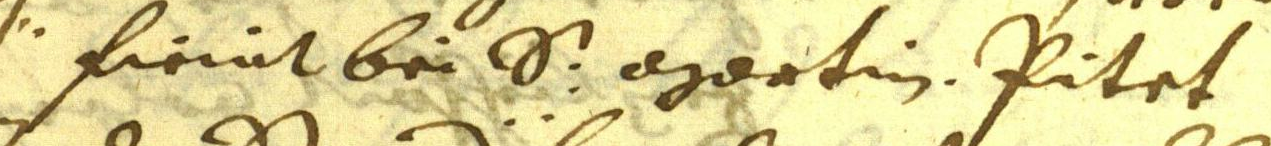ficiat bei S: Martin. Pitet
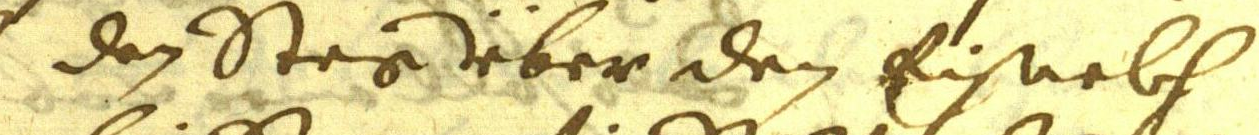den Steg v̈ber den Eisackh
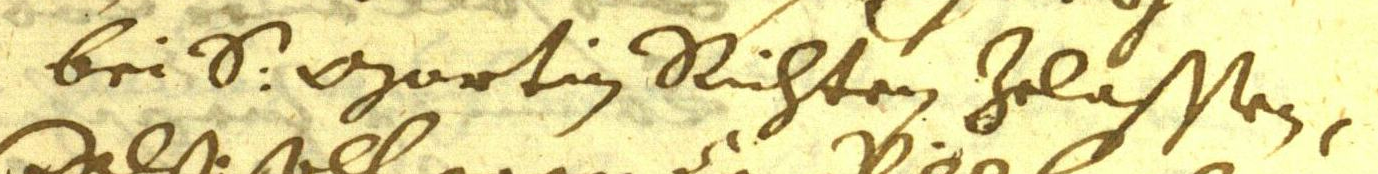bei S: Martin Richten Zelassen,
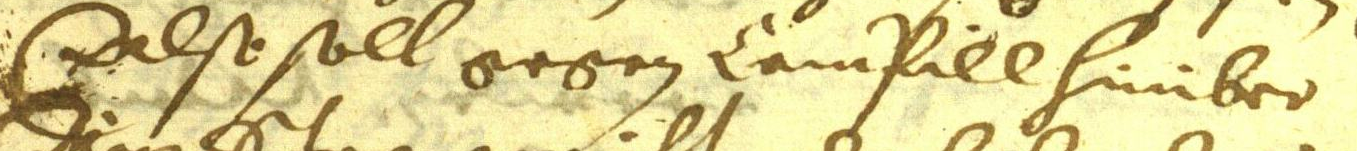Also soll gegen Cam Pill hiniber
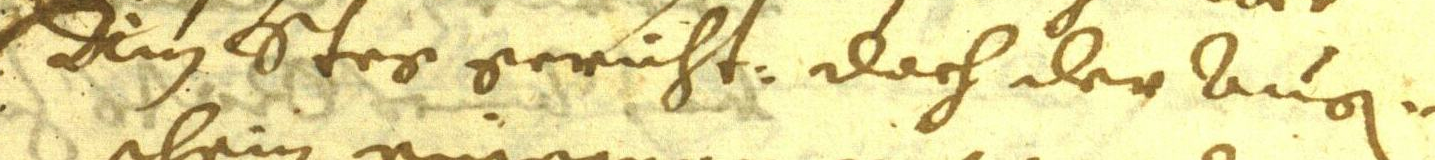Ain Steg gericht: doch der Aūg¬
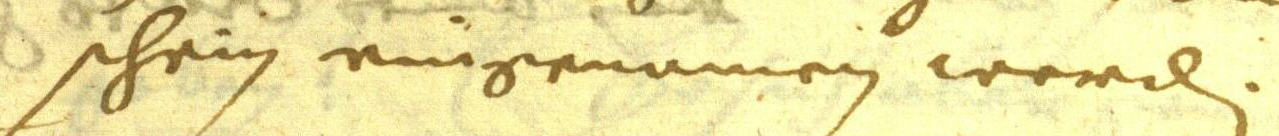schein eingenomen werd.
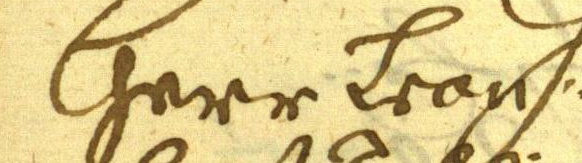Herr Leon¬
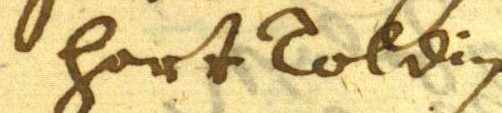hart Toldin
